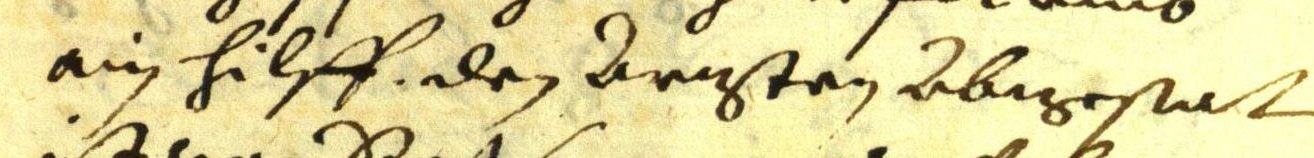ain hilff. den Arzten Abzestat
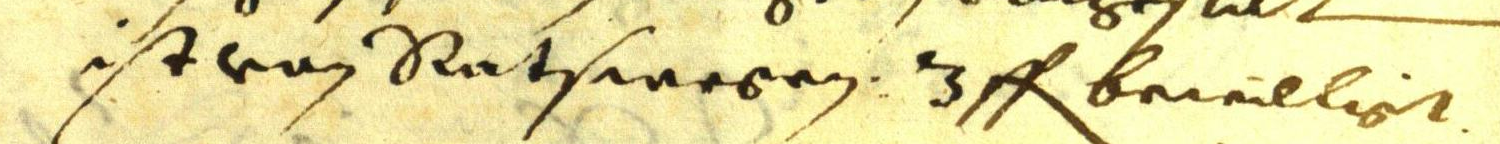Ist von Ratswegen: 3 fl bewilligt.
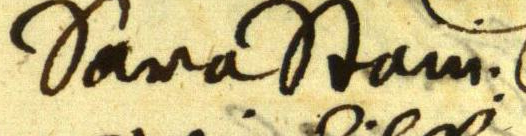Sara Stain¬
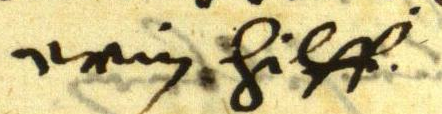erin hilff.
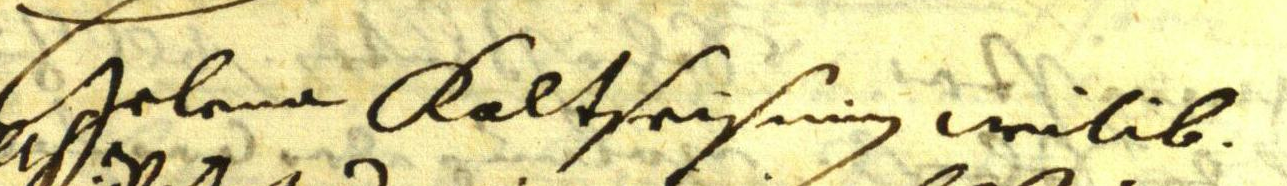Helena Kaltseisinn witib.
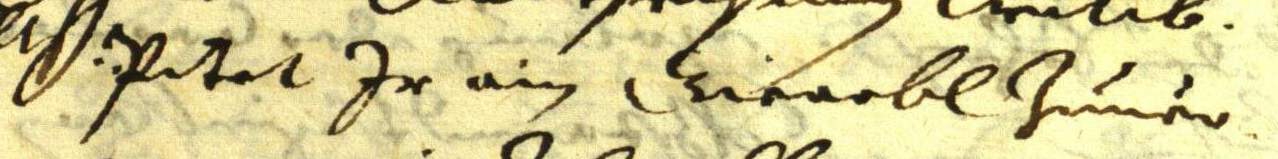Pitet Ir ain Gwerbl Zūuēr¬
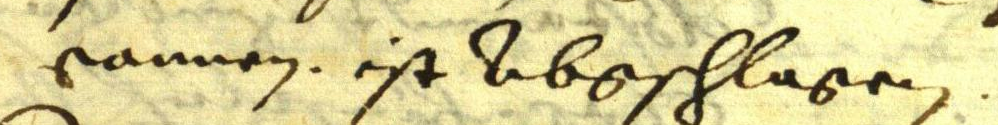gonnen. ist Abgschlagen.
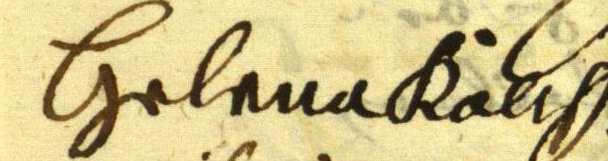Helena Kalts¬
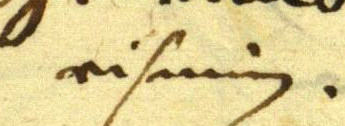eisinn.
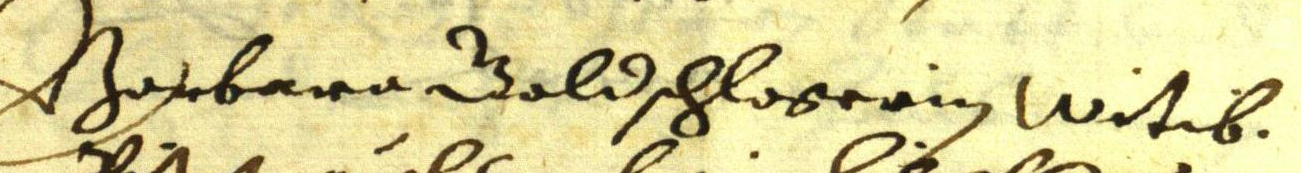Barbara Goldschlagering Witib.
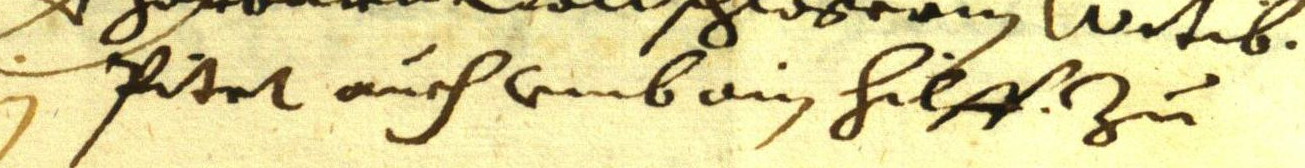Pitet aūch umb ain hilff. Zū
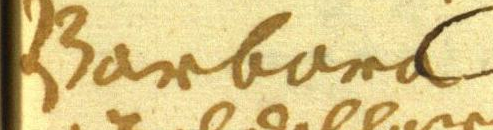Barbara
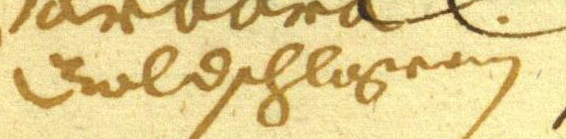Goldschlagerin
